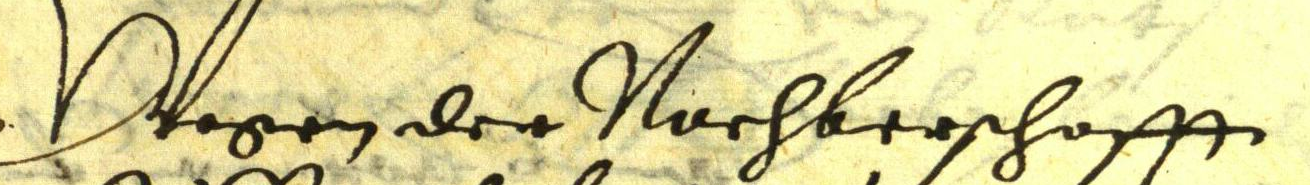Wegen der Nachberschafft
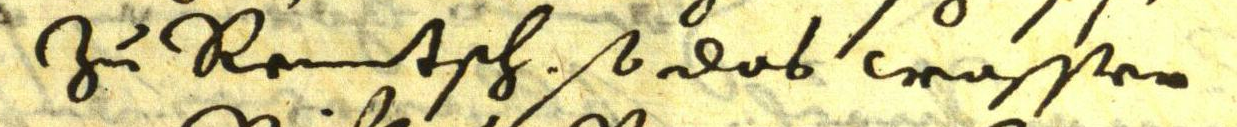Zū Renntsch. so das Wasser
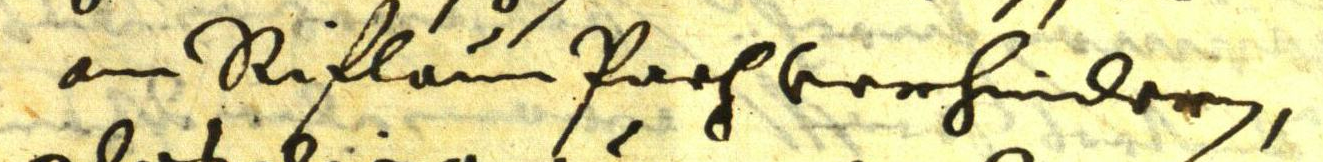am Riflaūn Pach verhindern,
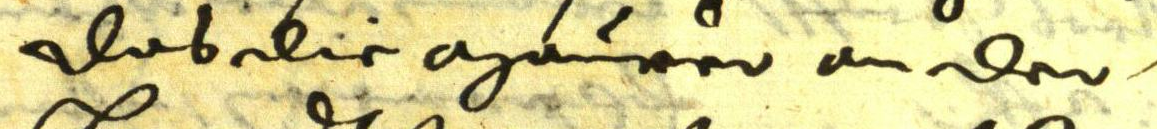das die Maūrer an der
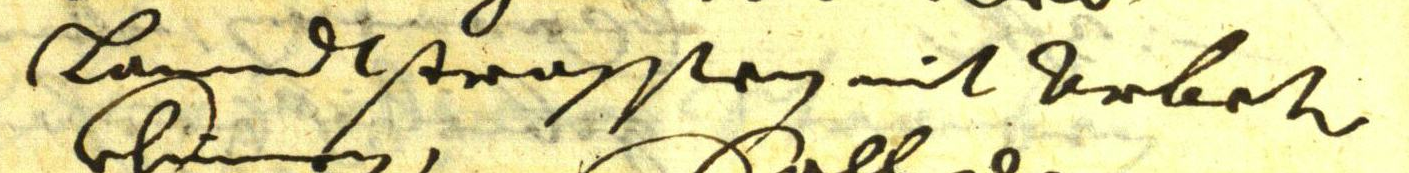Lanndtstrassen nit Arbet
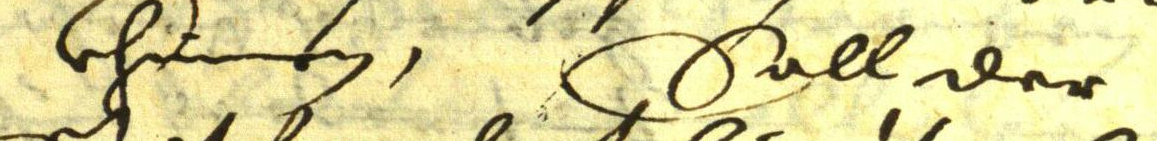khūnen, Soll der
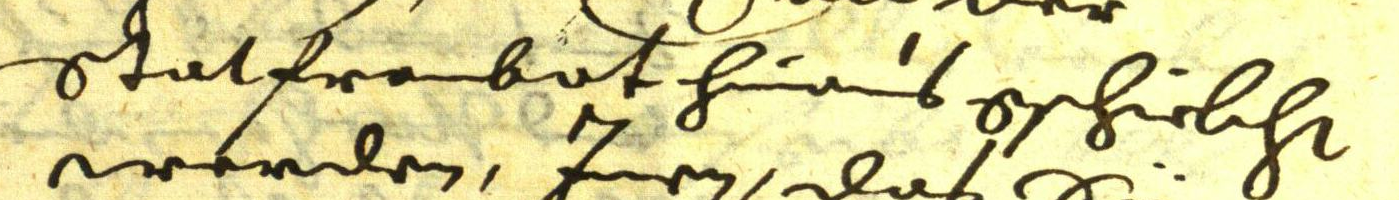Statfronbot hinaūs gschickht
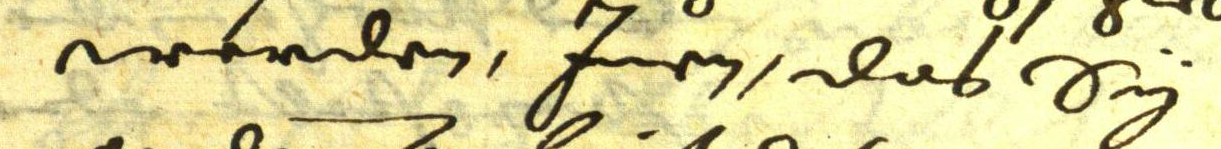werden, Inen das Sÿ
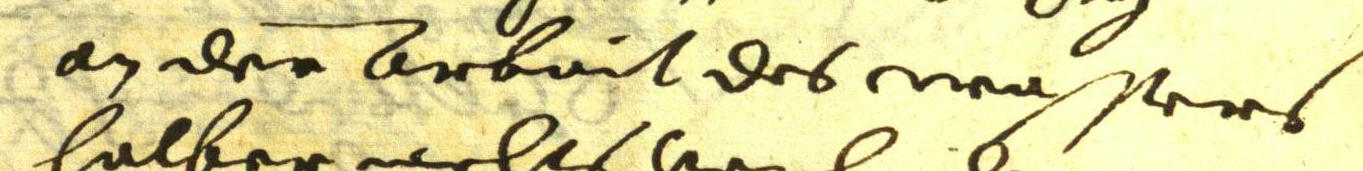an der Arbait des Wassers
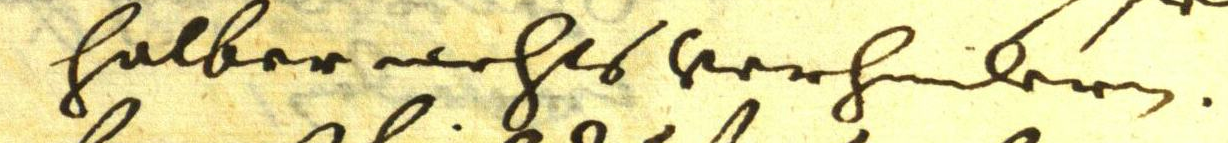halber nichts verhindern.
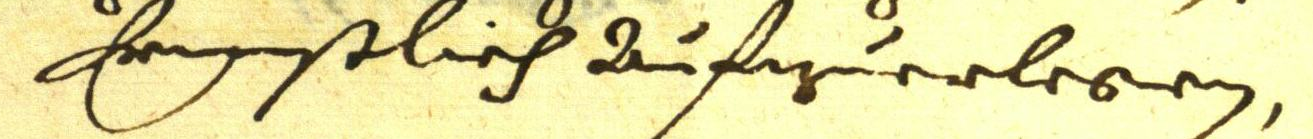Ernnstlich Aūfzūerlegen,
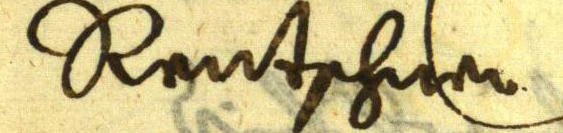Rentschner
